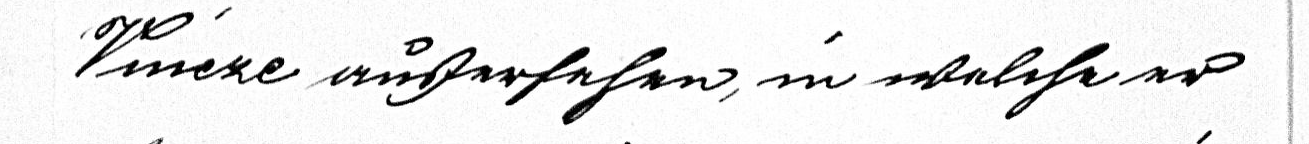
Vincze ausersehen, in welche er
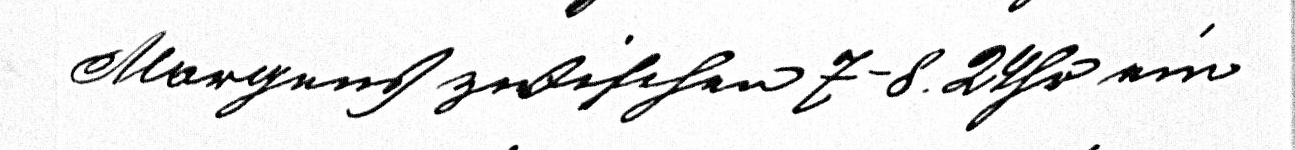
Morgens zwischen 7-8. Uhr ein
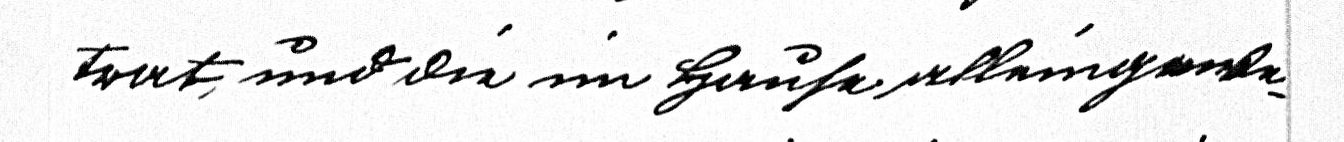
trat, und die im Hause alleingewe¬
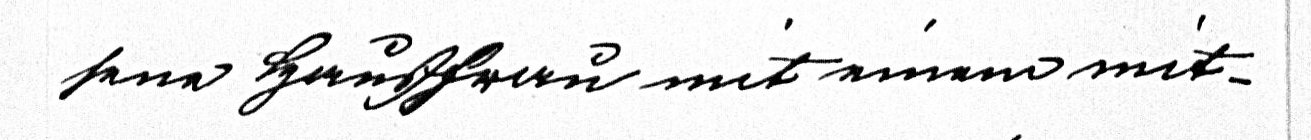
sene Hausfrau mit einem mit¬
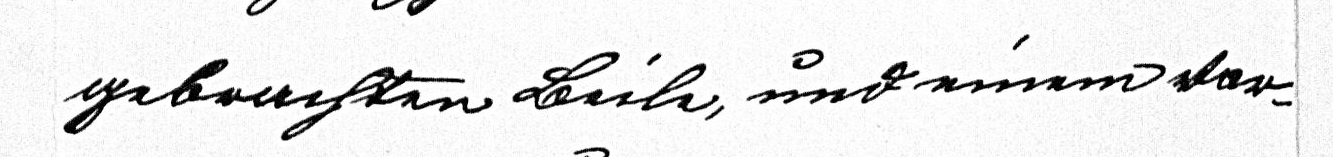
gebrachten Beile, und einem vor¬
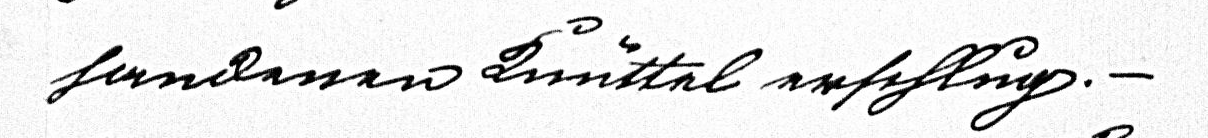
handenen Knüttel erschlug. -
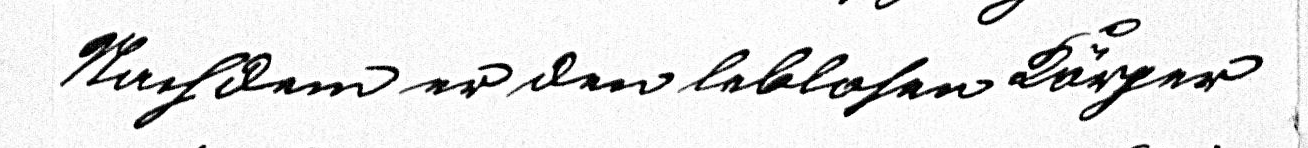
Nach dem er den leblosen Körper
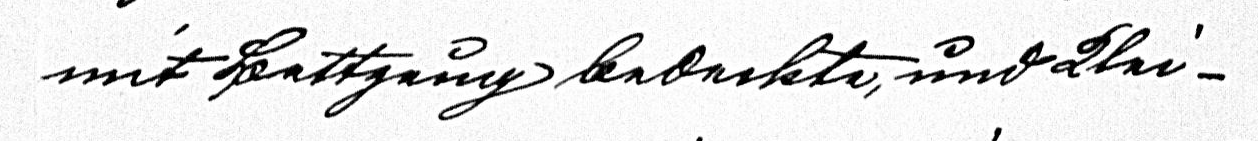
mit Bettzeug bedeckte, und Klei¬
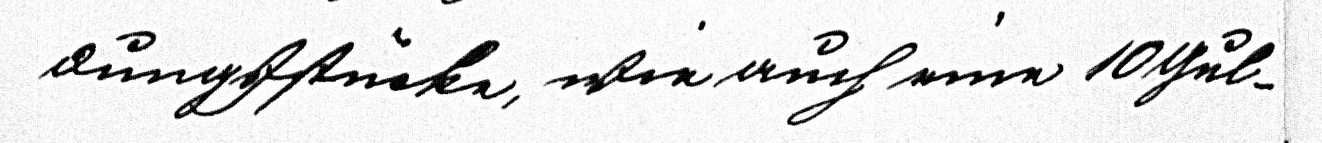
dungstücke, wie auch eine 10 Gul¬
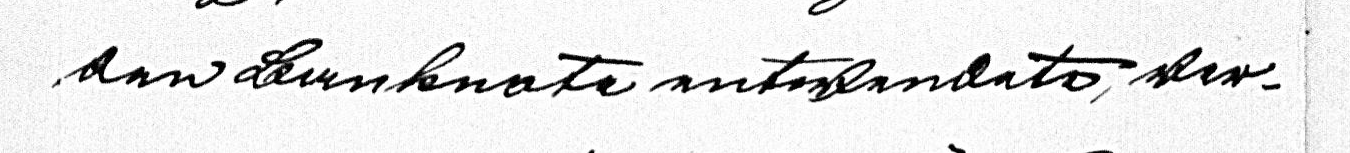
den Banknote entwendete, ver¬
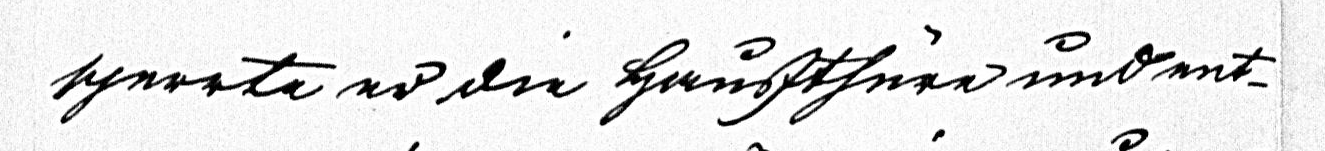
schnerte er die Hausthüre und ent¬
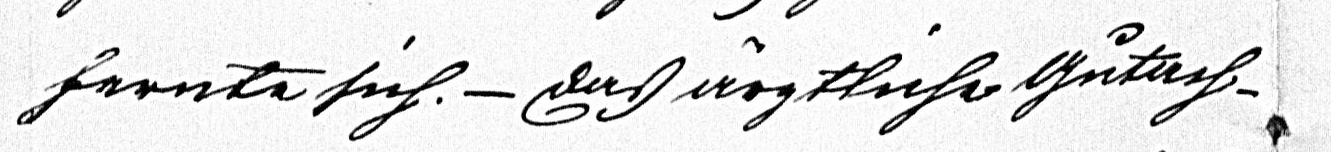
fernte sich. - das ärztliche Gutach¬
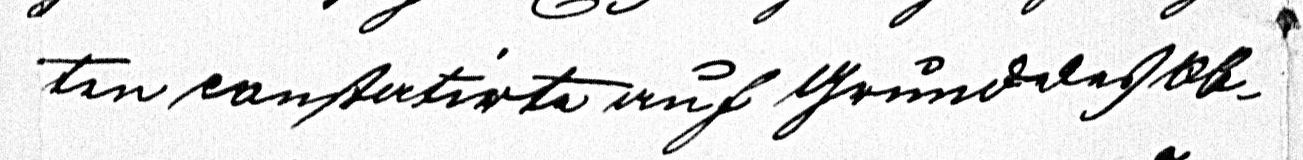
ten constatirte auf Grund des Ob¬
